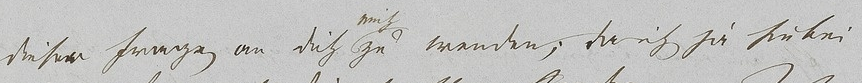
dieser Frage an dich mich zu wenden; da ich ja hiebei
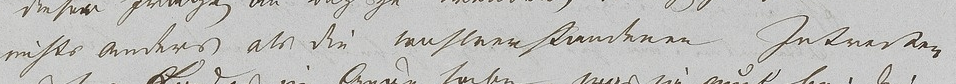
nichts anders als die wohlverstandenen Intreßen
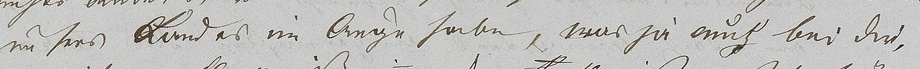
unsers Landes im Auge habe, was ja auch bei dir,
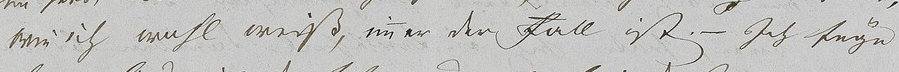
wie ich wohl weiß, immer der Fall ist. – Ich füge
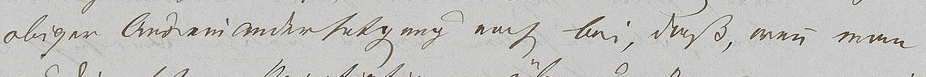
obiger Auseinandersetzung noch bei, daß, wenn man
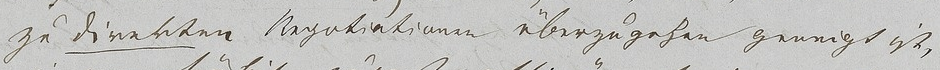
zu direkten Negotiationen überzugehen geneigt ist,
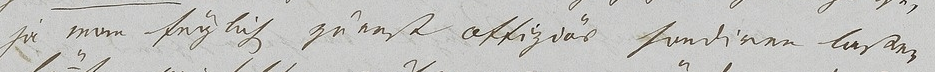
ja man füglich zuerst offiziös sondiren laßen
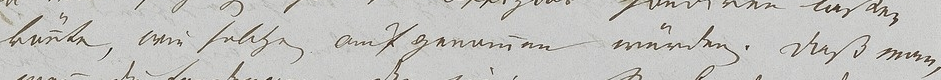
könnte, wie solche aufgenommen würden. Daß man,
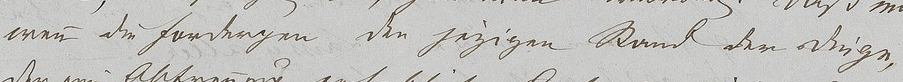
wenn die Fordergen den jezigen Stand der Dinge,
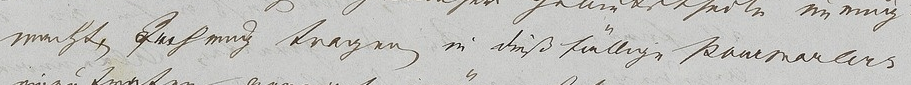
macht, Rechnung tragen, in dießfällige pourparlers
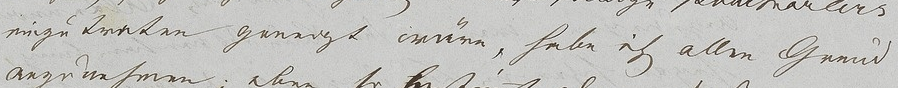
einzutreten geneigt wäre, habe ich allen Grund
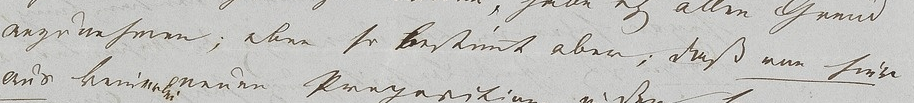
anzunehmen; eben so bestimmt aber; daß von hier
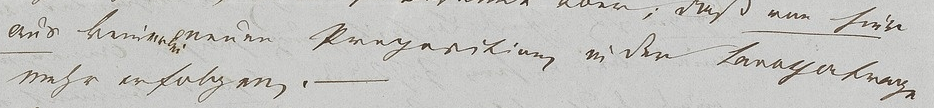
aus keinerlei neuen Propositionen in der Savoyer frage
